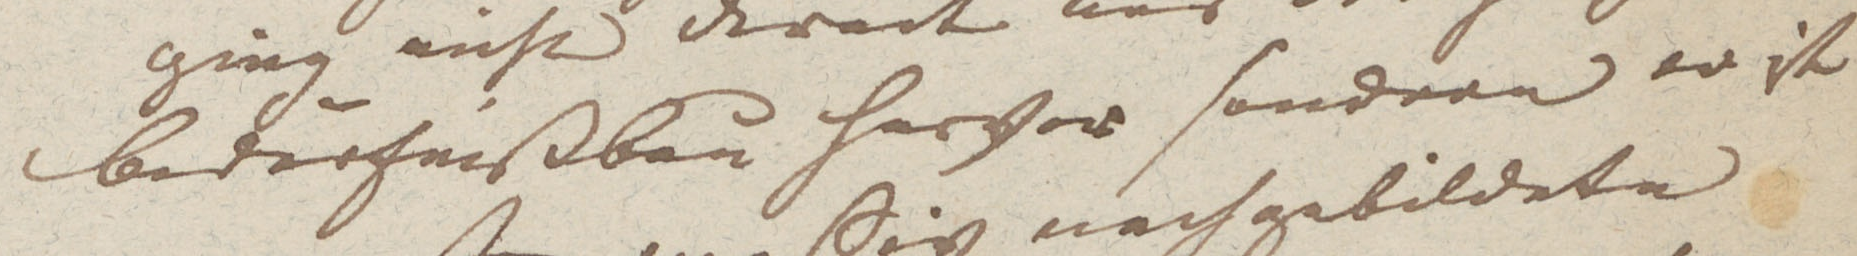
Bedürfnisbau hervor sondern er ist
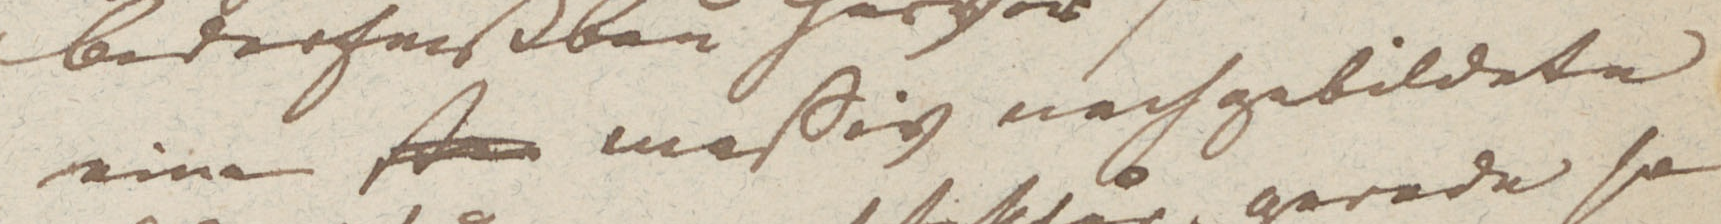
eine stei massiv nachgebildete
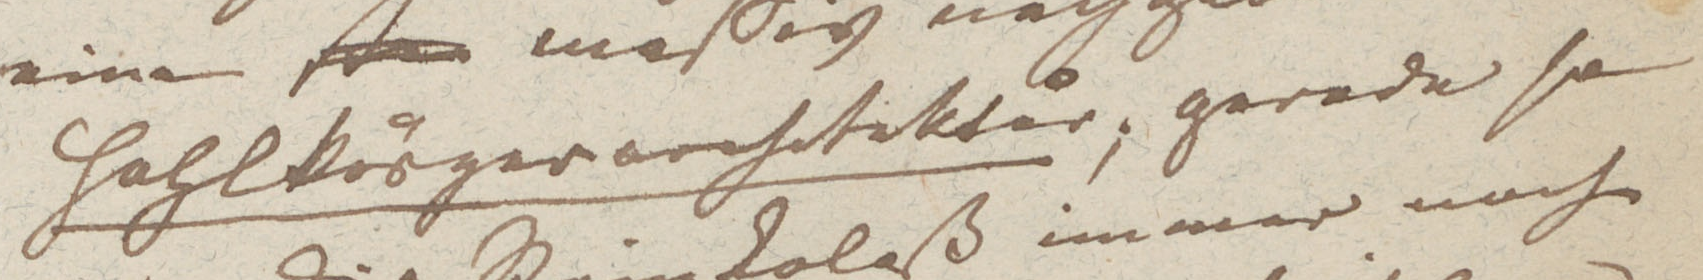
Hohlkörperarchitektur; gerade so
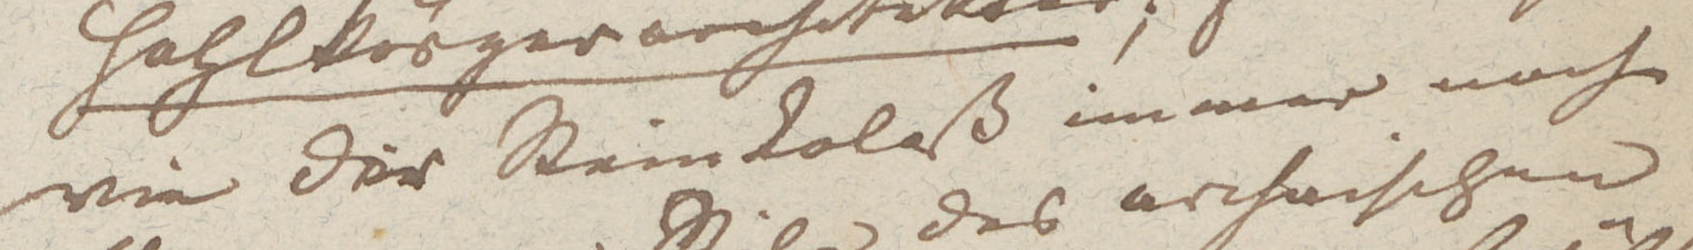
wie dieer Steinkoloss immer noch
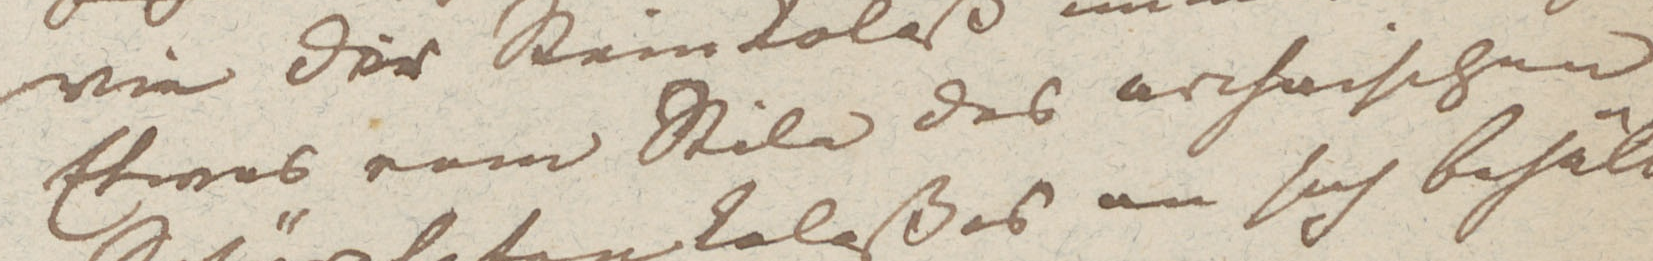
Etwas vom Stile des archaischen
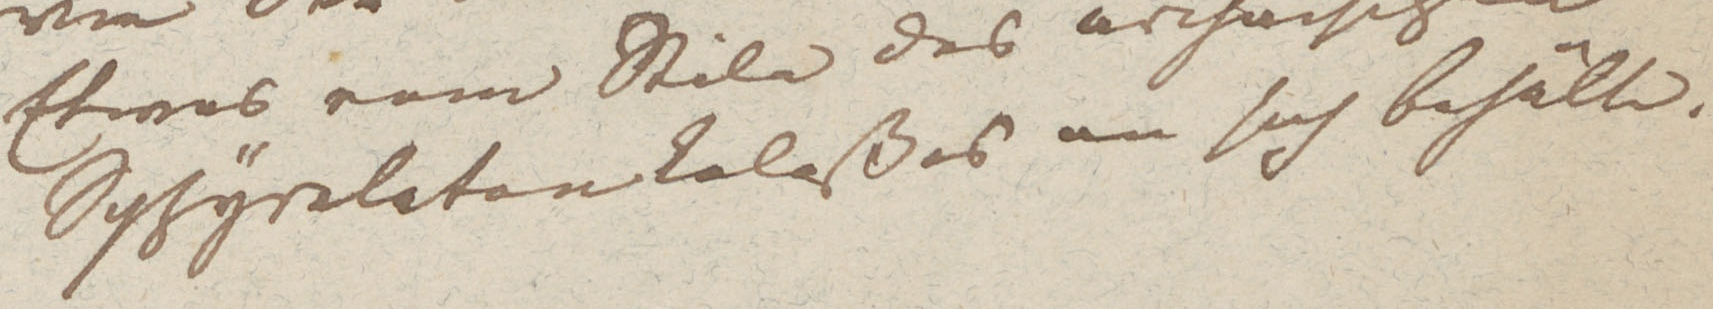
Sphyrelatonkolosses an sich behält.
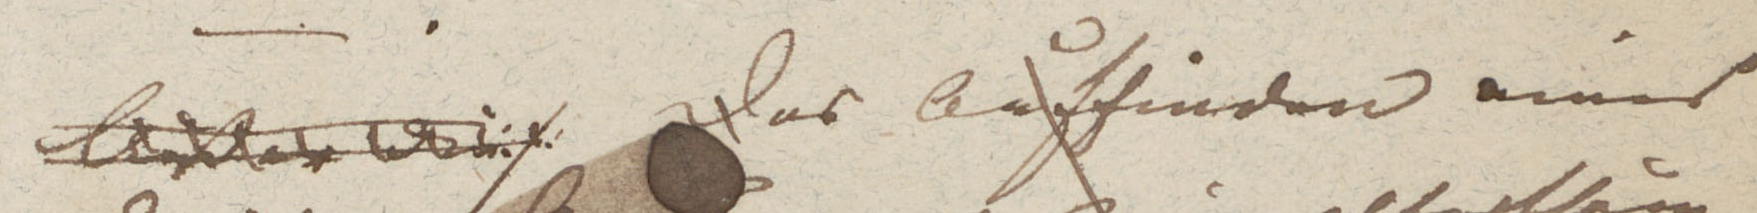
Ausser dies Das Auffinden eines
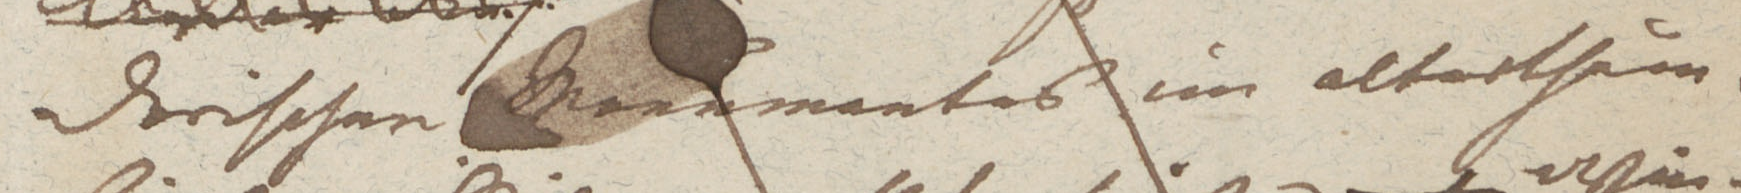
Dorischen Monumentes im alterthüm-
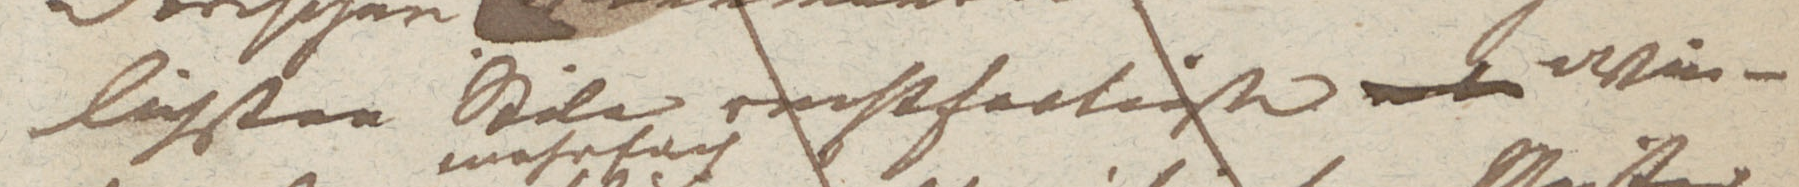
lichsten Stile rechtfertigt wie-
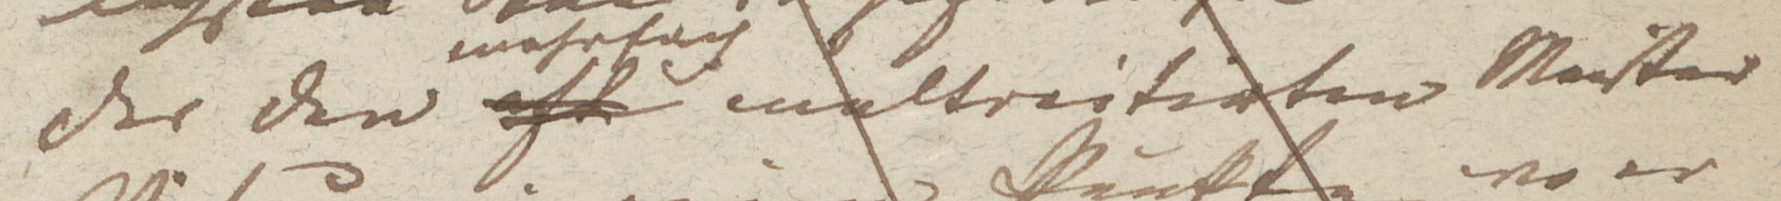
der den oft mehrfach maltraitirten Meister
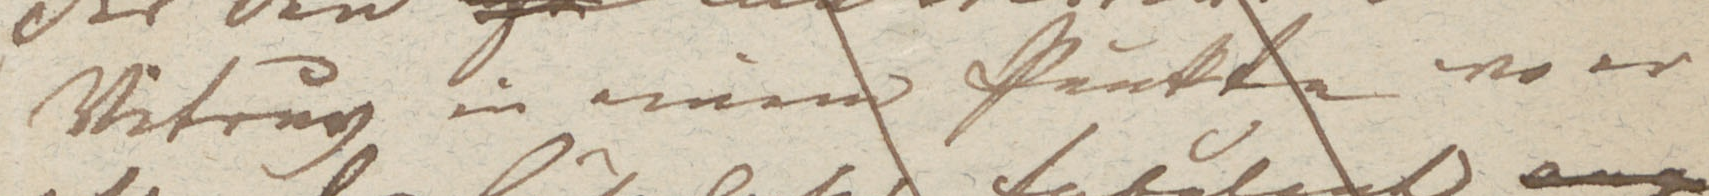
Vitruv in einem Punkte wo er
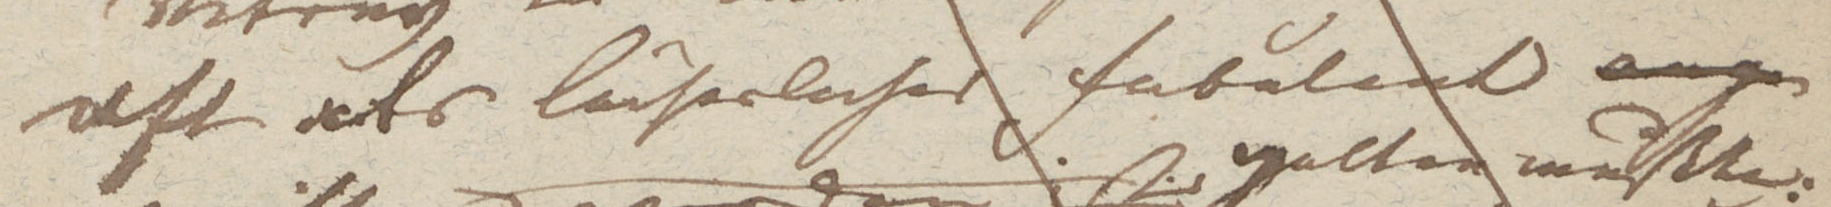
oft als lserlicher Fabulant ange-
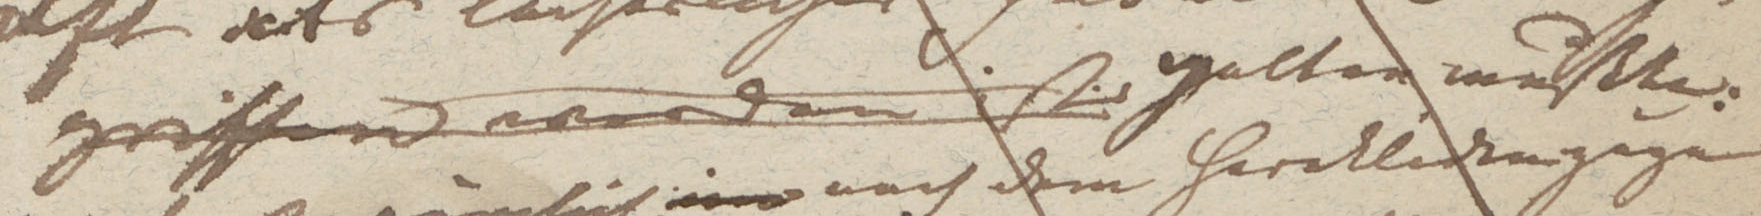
griffen worden ist gelten musste:
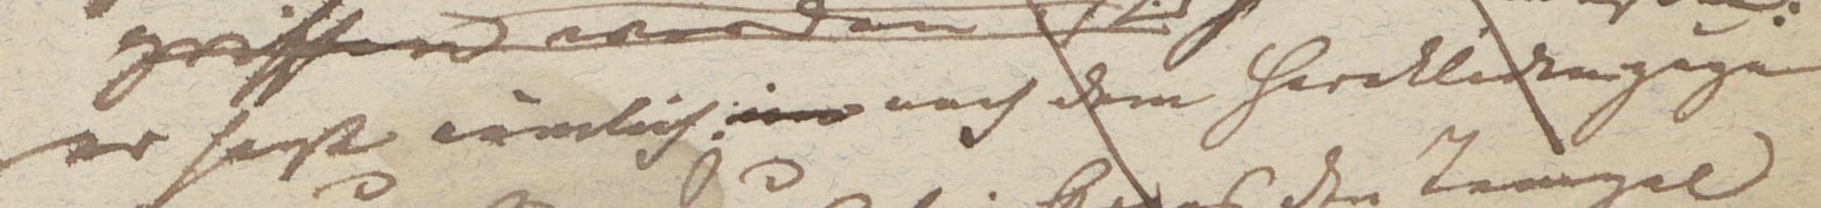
er sagt nämlich im nach dem Heraklidenzuge
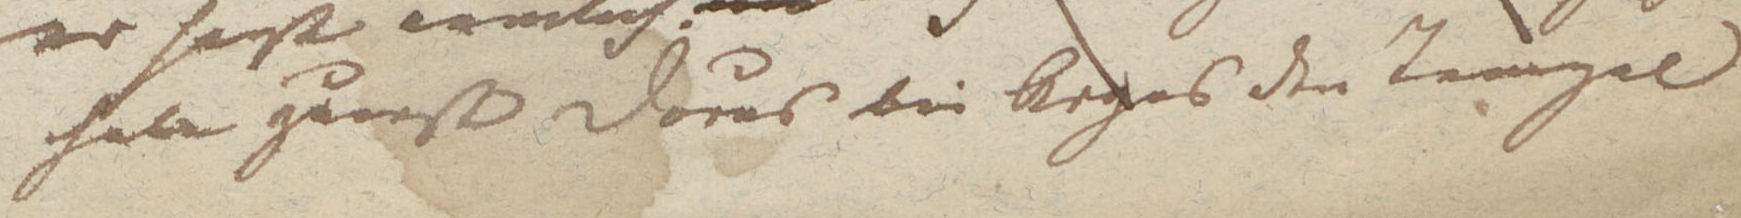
habe zuerst Dorus bei Argos den Tempel
